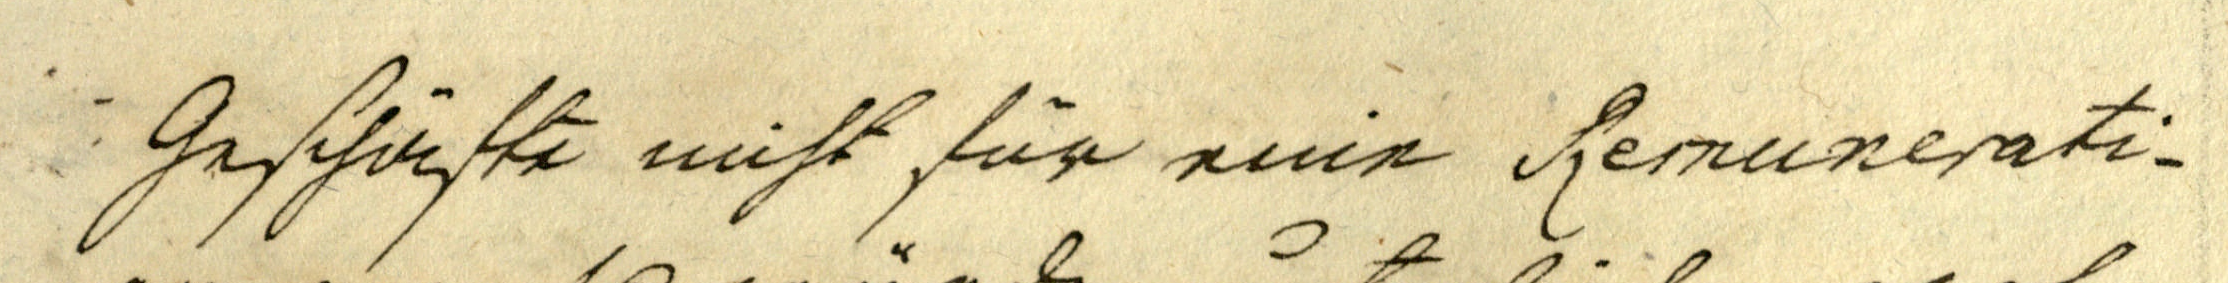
Geschäfte nicht für eine Remunerati¬
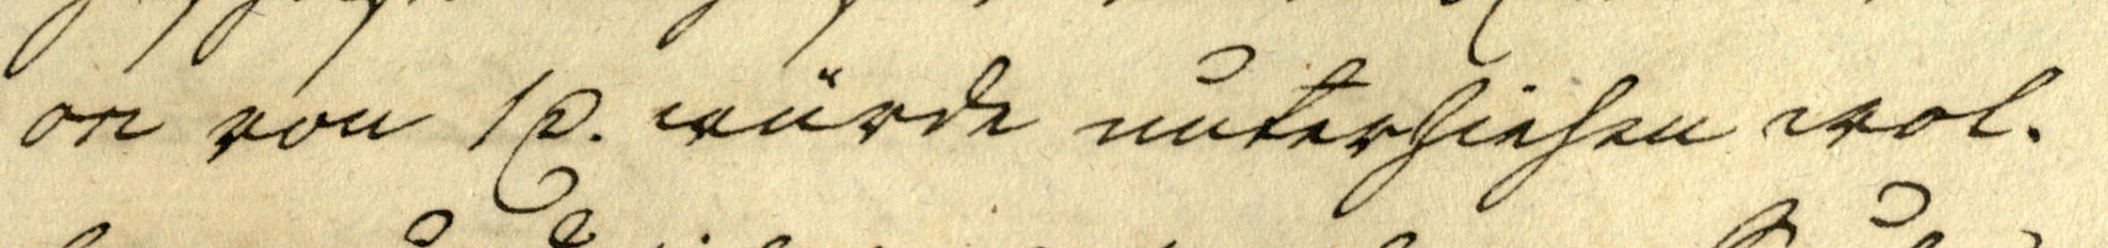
on von 1l. würde unterziehen wol¬
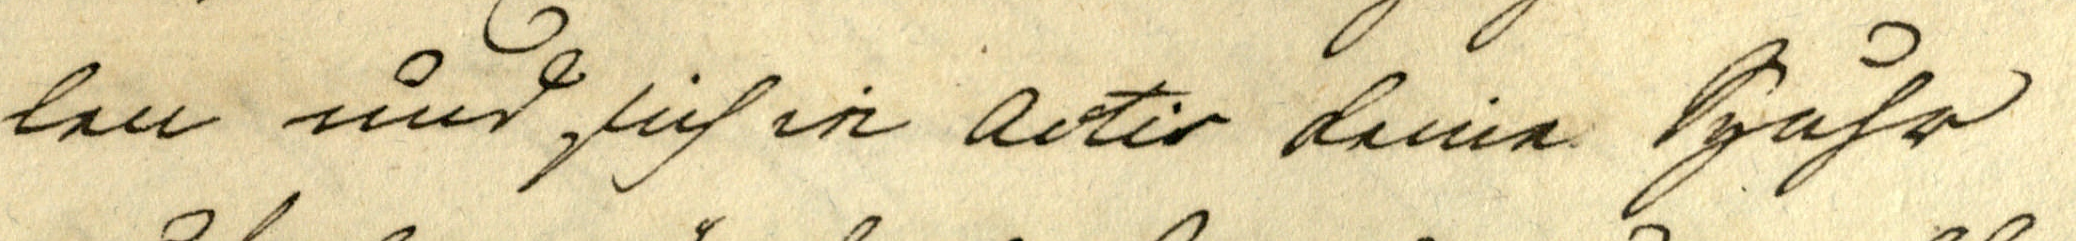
len und sich in Actis keine Spuhr
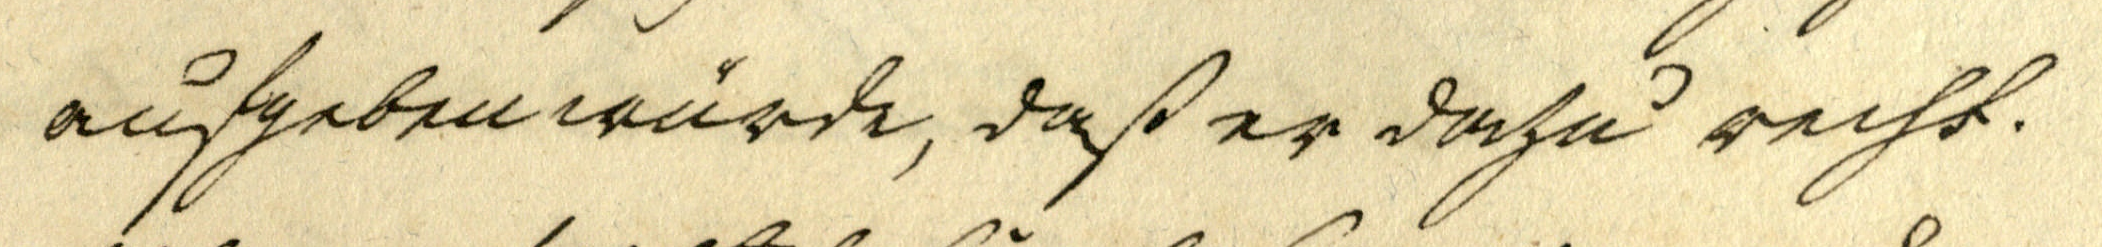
aufgeben würde, daß er dazu recht¬
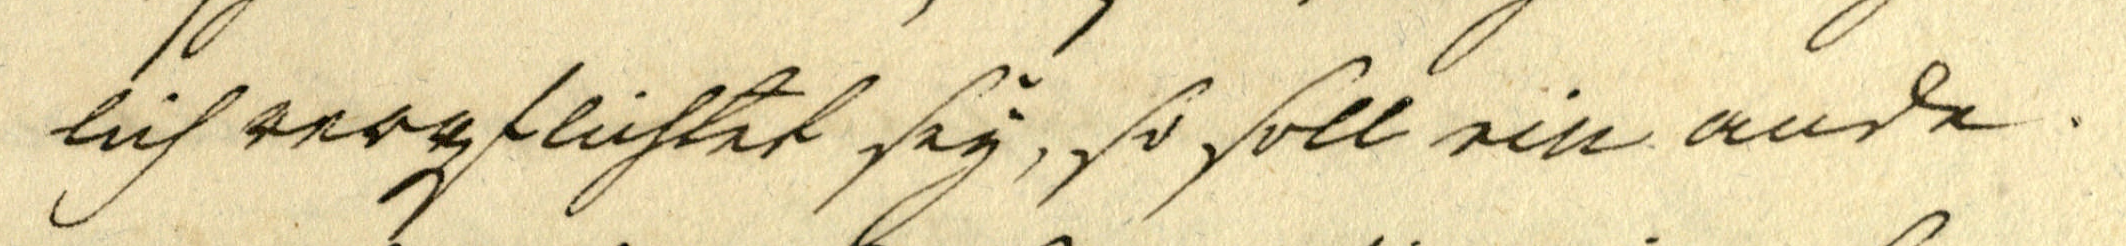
lich verpflichtet seÿ, so soll ein ande¬
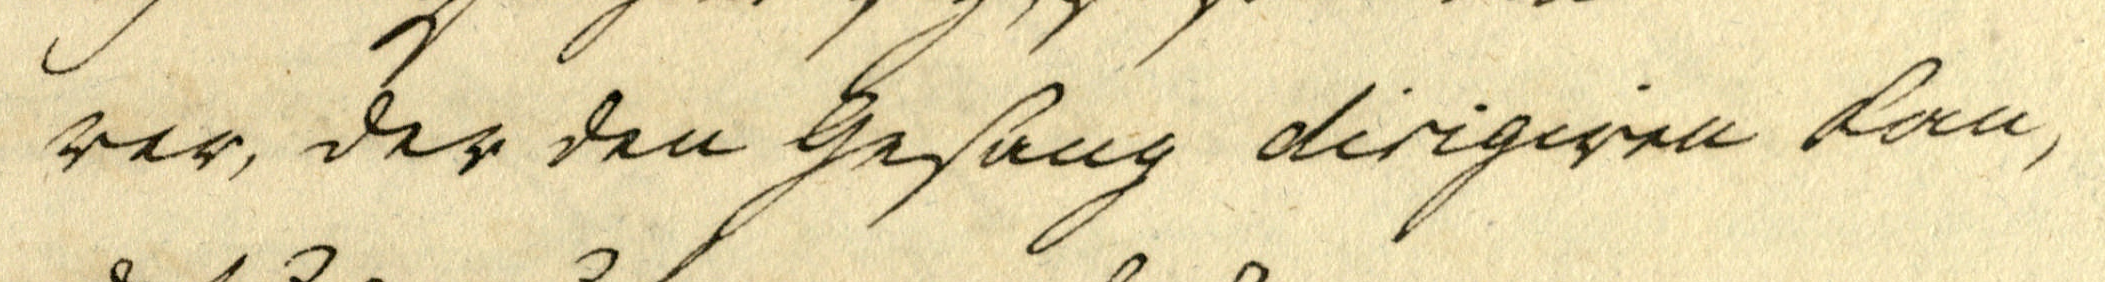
rer, der den Gesang dirigiren kan,
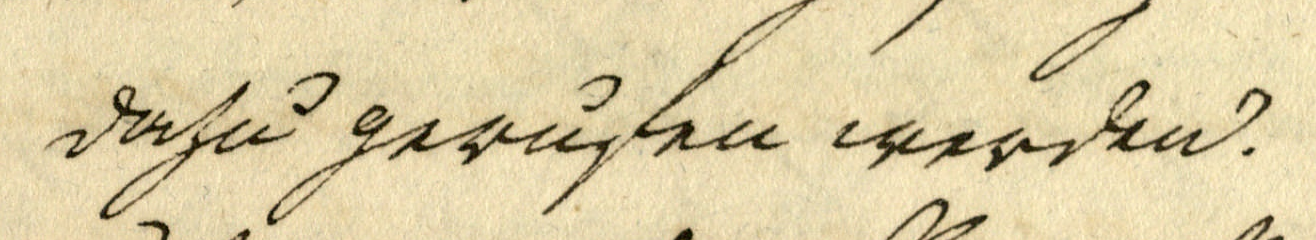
dazu gerufen werden.
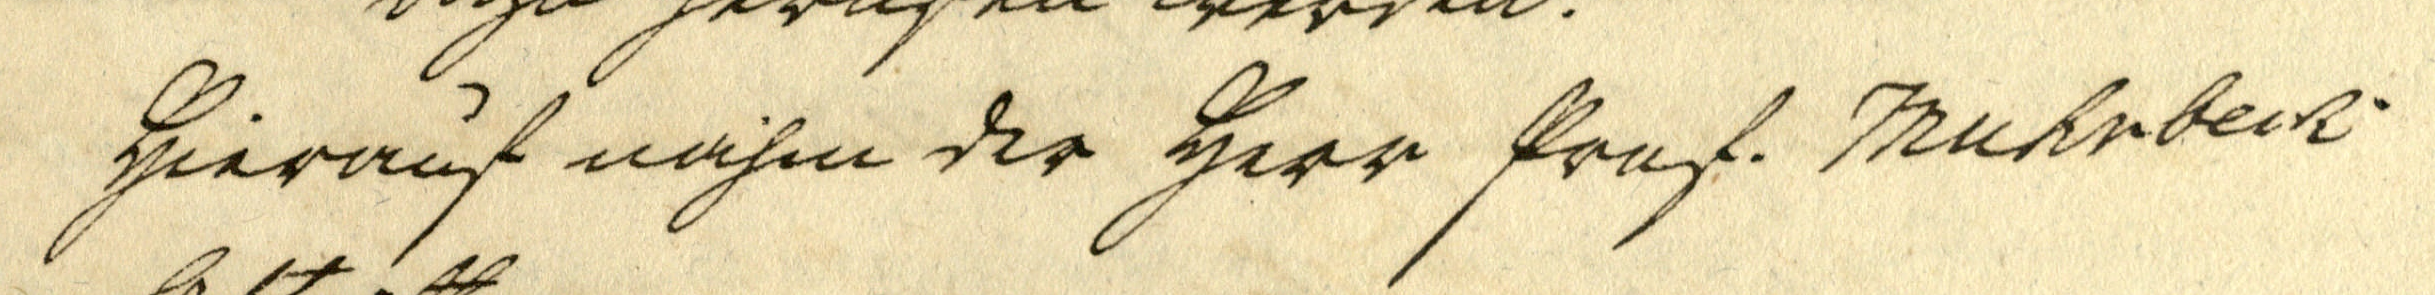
Hierauf nahm der Herr Prof. Muhrbeck
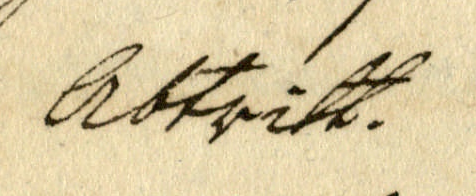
Abtritt.
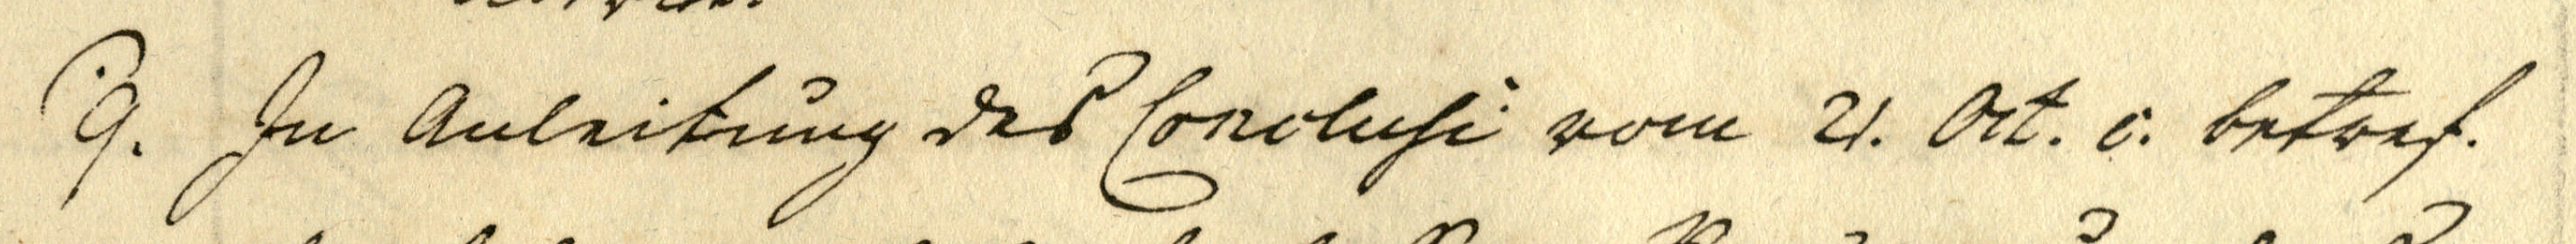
9. In Anleitung des Conclusi vom 21. Oct. c. betref¬
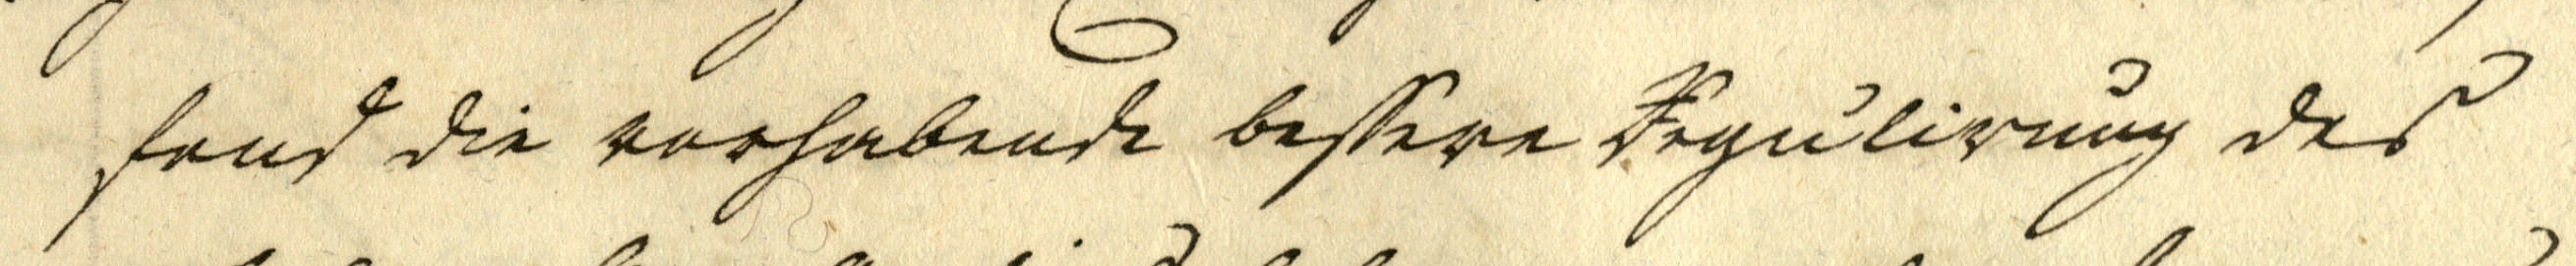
fand die vorhabende bessere Regulirung des
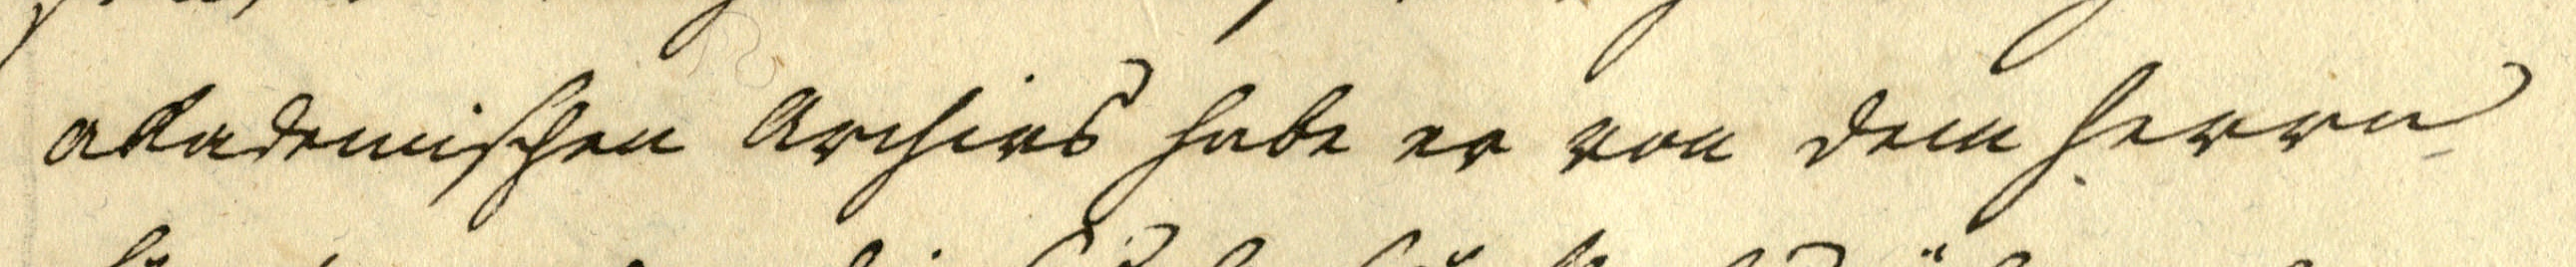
akademischen Archivs habe er von dem Herrn
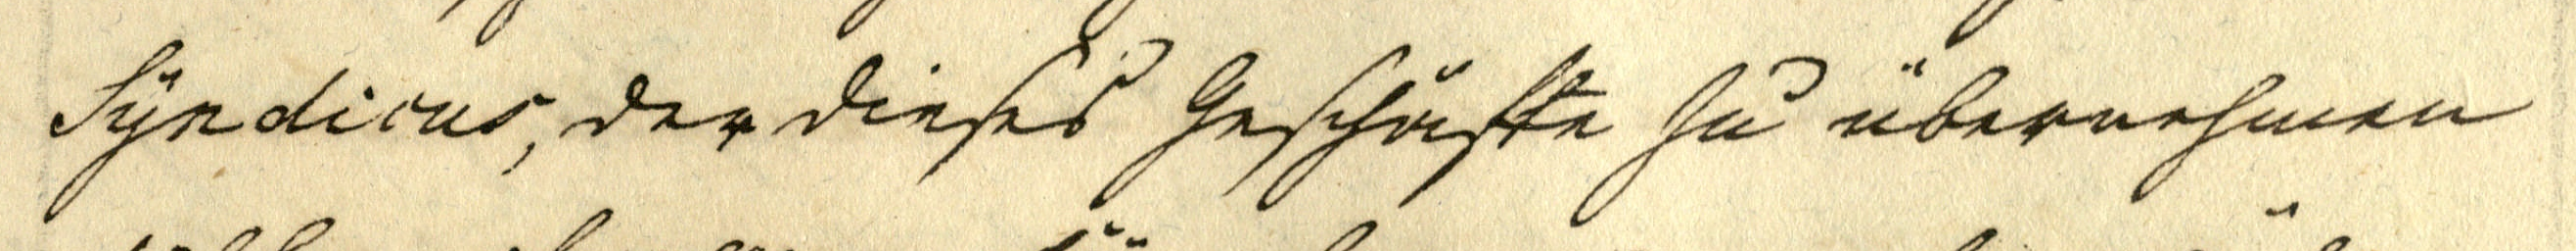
Sÿndicus, der dieses Geschäfte zu übernehmen
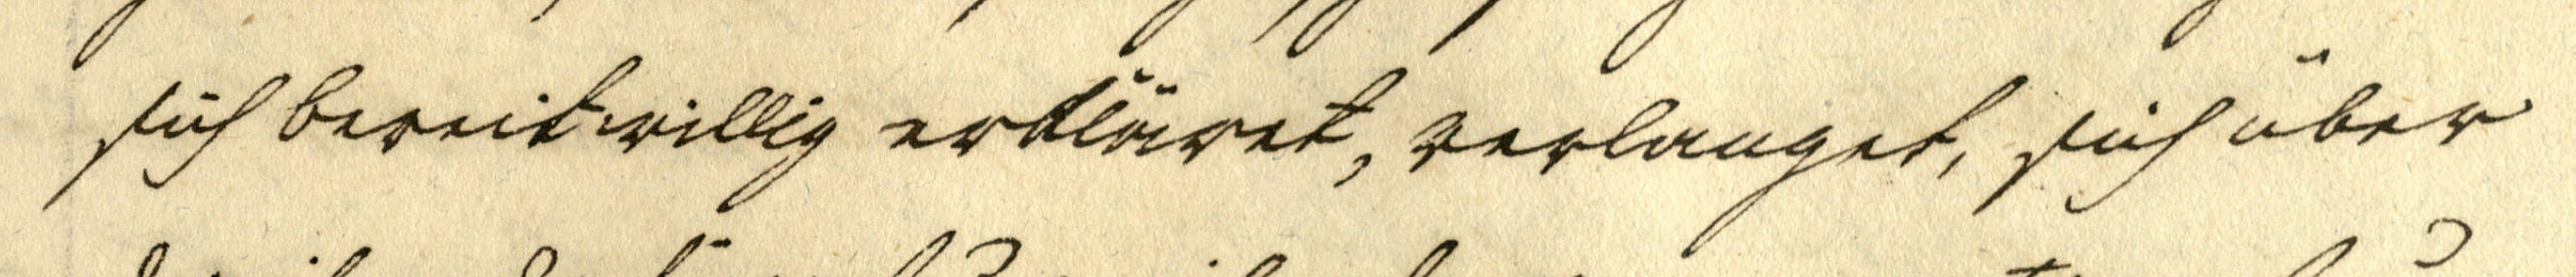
sich bereitwillig erkläret, verlanget, sich über
